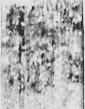鄝
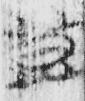莫
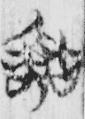囂
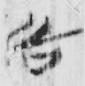左
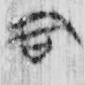司
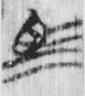馬
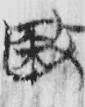殹
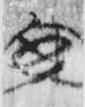安
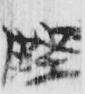陵
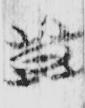莫
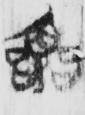囂
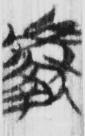○（狎）
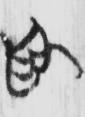爲
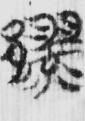鄝
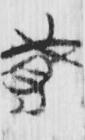○（貸）
